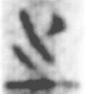之
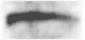一
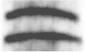二
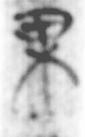果（戈）
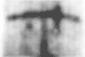一
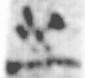之
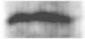一
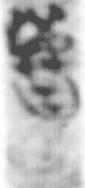晉
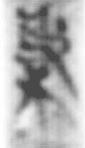杸
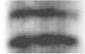二
